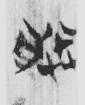朕
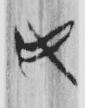女
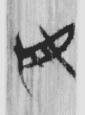母
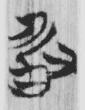敢
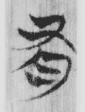有
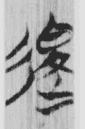退
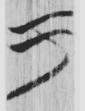于
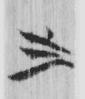之
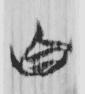自
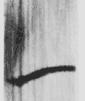一
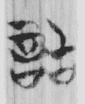話
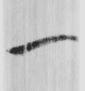一
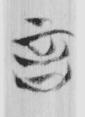言
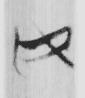女
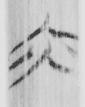亦
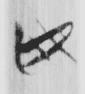母
